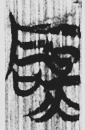○（庶）
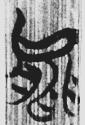能
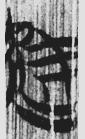進
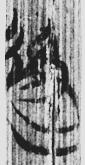後
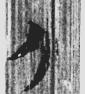人
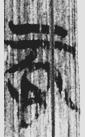○（愿）
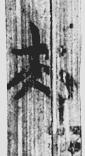大夫
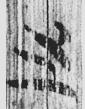之
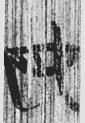母（勿）
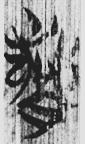□（留○）
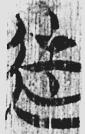徒
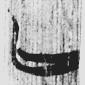㠯（以）
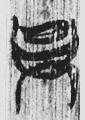員
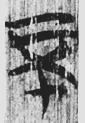不
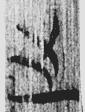之
